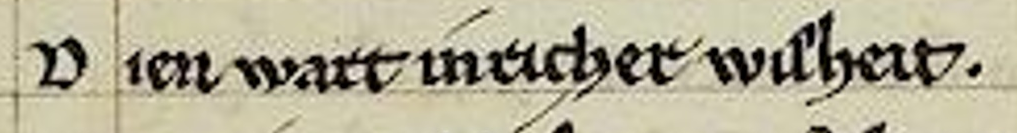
Dien wart inricher wiſheit.
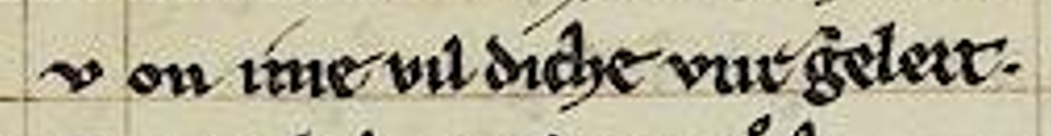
Von ime vil diche vur geleit.
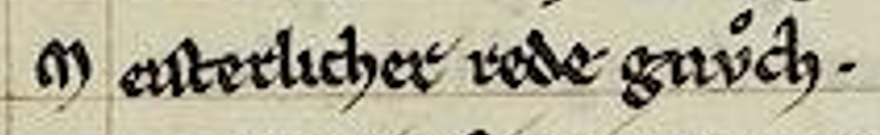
Meiſterlicher rede gnv°och.
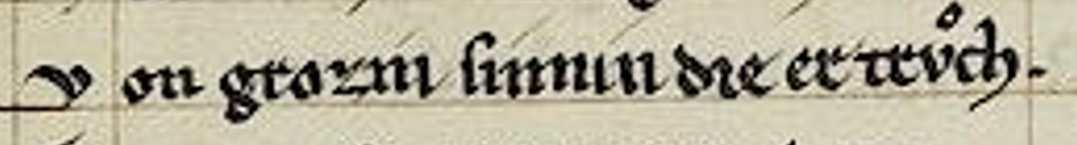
Von grozin ſinnin die er trv°och.
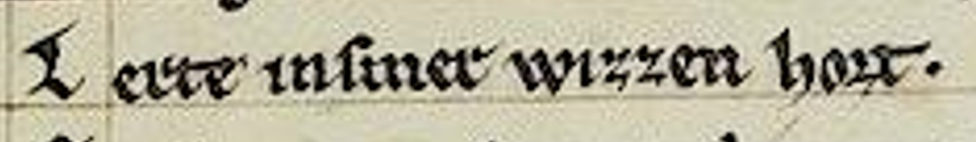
Lerte inſiner wizzen hort.
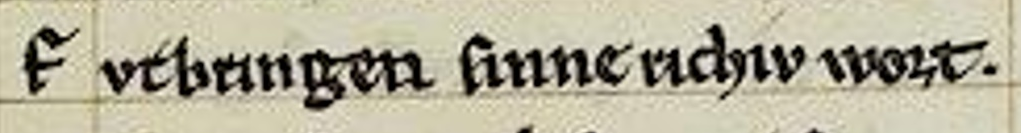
Fvrbringen ſinne richiv wort.
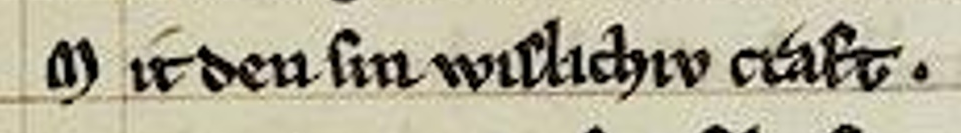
Mit den ſin wiſlichiv craft.
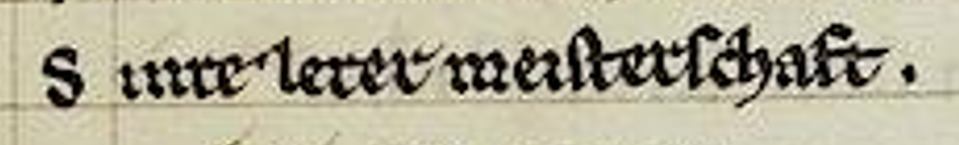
Sinre lerer meiſterſchaft.
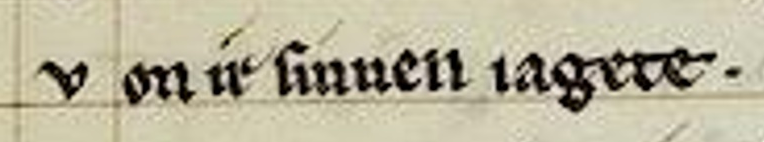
Von ir ſinnen iagete.
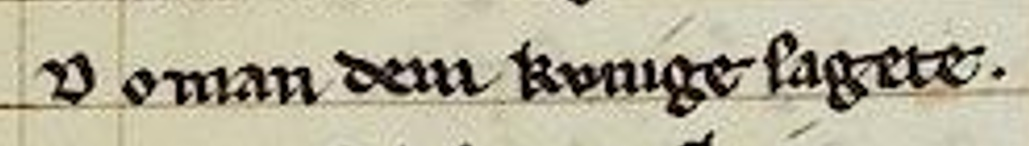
Do man dem kvnige ſagete.
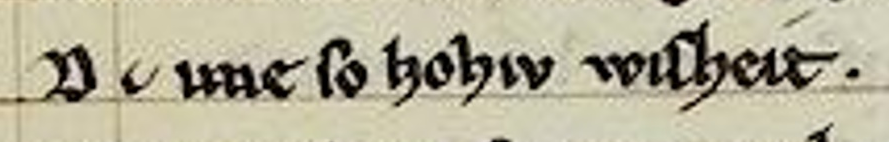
D(az) ime ſo hohiv wiſheit.
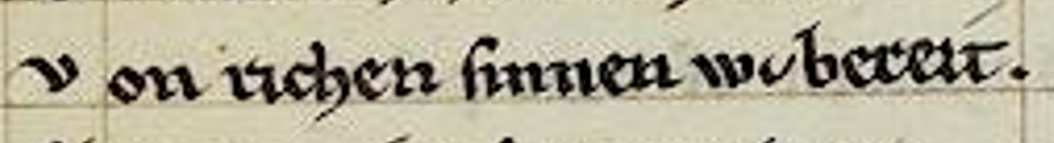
Von richen ſinnen w(az) bereit.
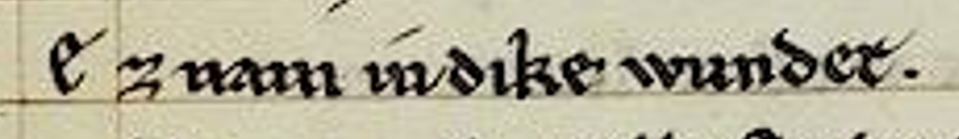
Ez nam in dike wunder.
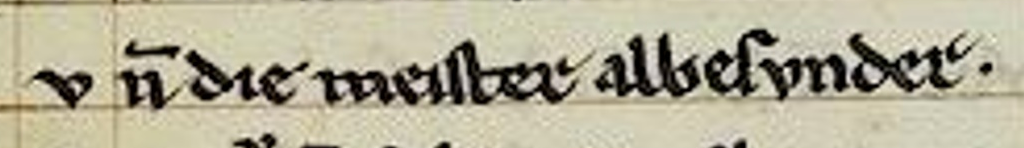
Vn(d) die meiſter albeſvnder.
